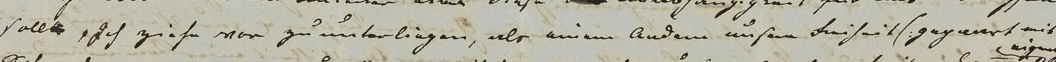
soll. Ich ziehe vor zu unterliegen, als einem Andern unsre Freiheit (:gepaart mit
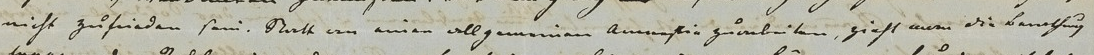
nicht zufrieden sein. Statt an einer allgemeinen Amnestie zu arbeiten, zieht man die Berathung
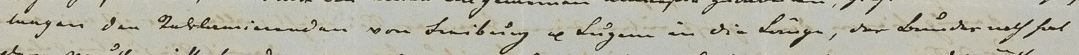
wegen den Reklamierenden von Freiburg u Luzern in die Länge, der Bundesrath hat
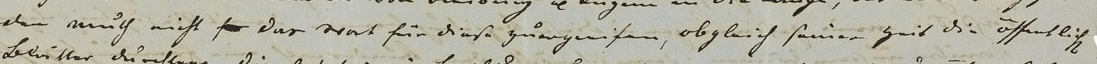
den Muth nicht ... das Wort für diese zu ergreifen, obgleich seiner Zeit die öffentlichen
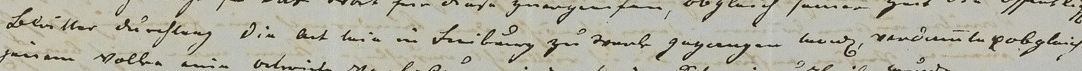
Blätter durchweg die Art wie in Freiburg zu rank gegangen ward, verdammten u obgleich
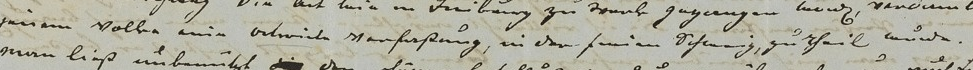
jenem Volke eine ... Verfaßung, in der freien Schweiz, zu Theil wurde.
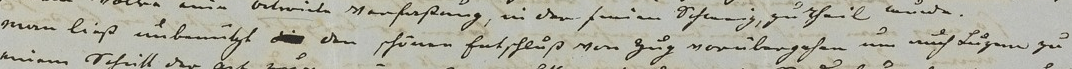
Man ließ unbenützt ... den schönen Entschluß von Zug vorübergehen um auch Luzern zu
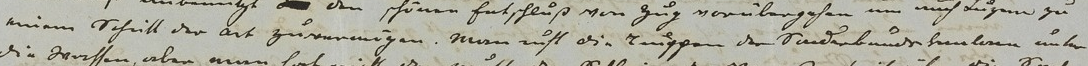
einem Schritt der Art zu vermögen. Man ruft die Truppen der Sonderbundskantone unter
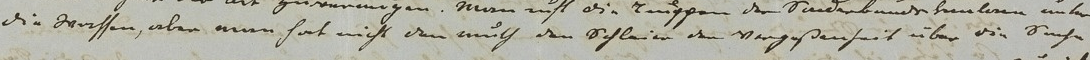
die Waffen, aber man hat nicht den Muth den Schleier der Vergeßenheit über die Sache
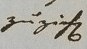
zu ziehen
